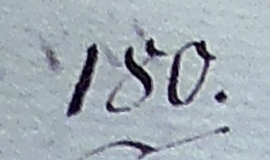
180.
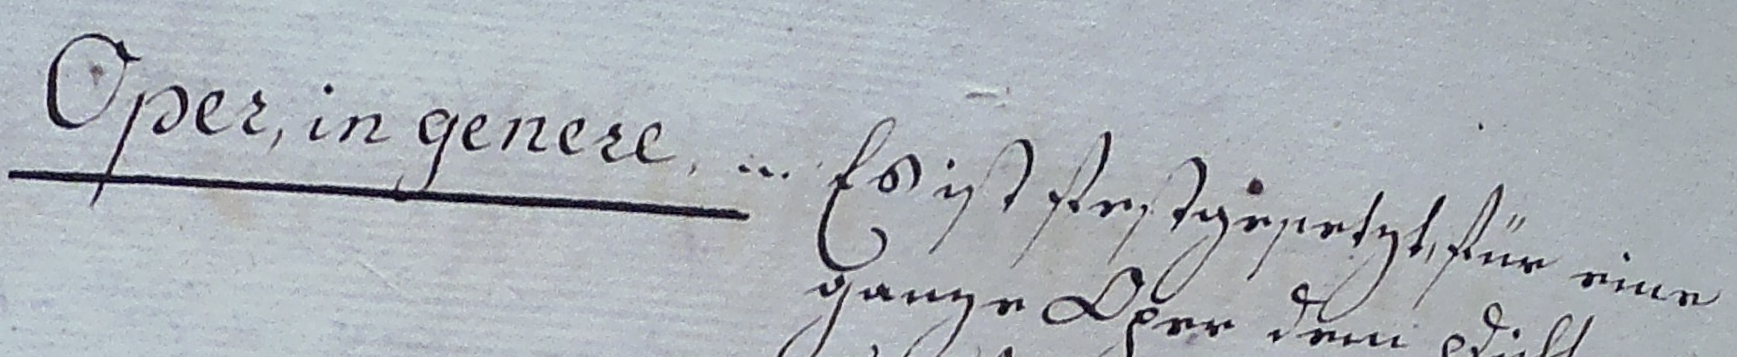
Oper,in genere, ... Es ist festgesetzt. für eine
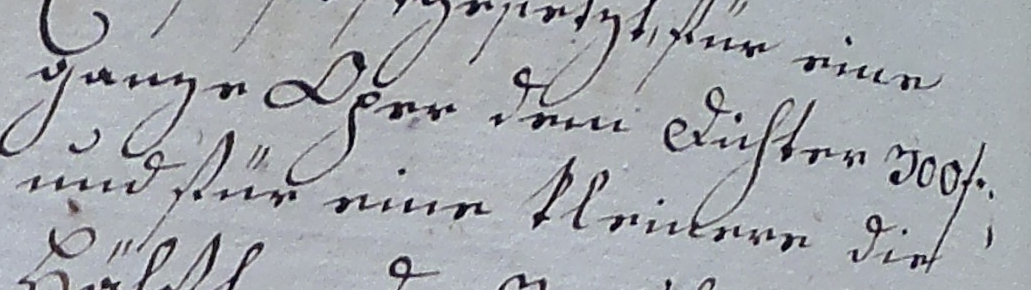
ganze Oper dem Dichter 300fr.
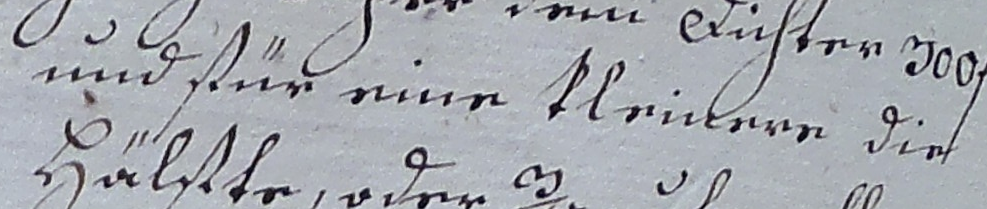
und für eine kleinere die
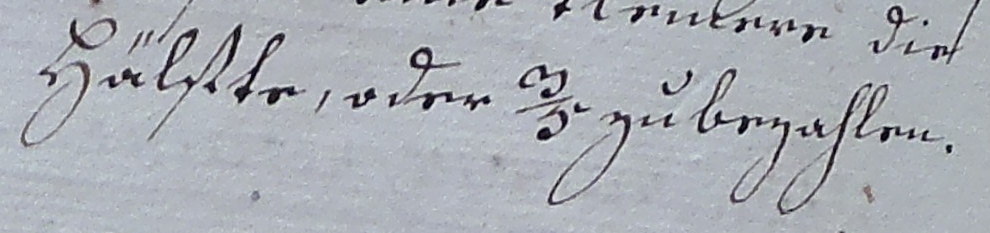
Hälfte, oder 3/5 zu bezahlen.
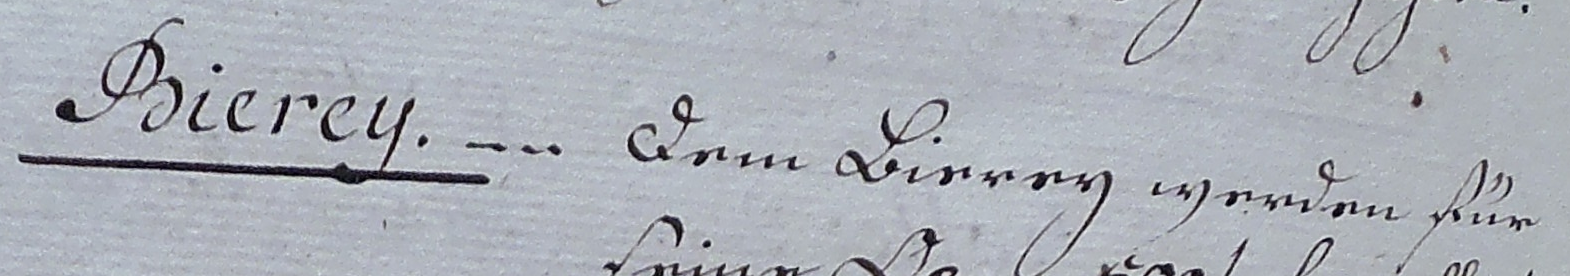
Bierey. .. .. Dem Bierey werden für
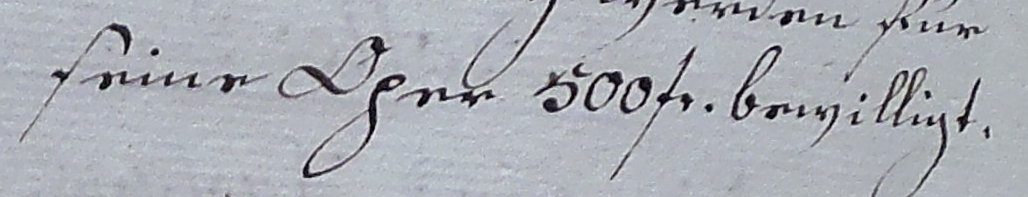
seine Oper 500fr. bewilligt.
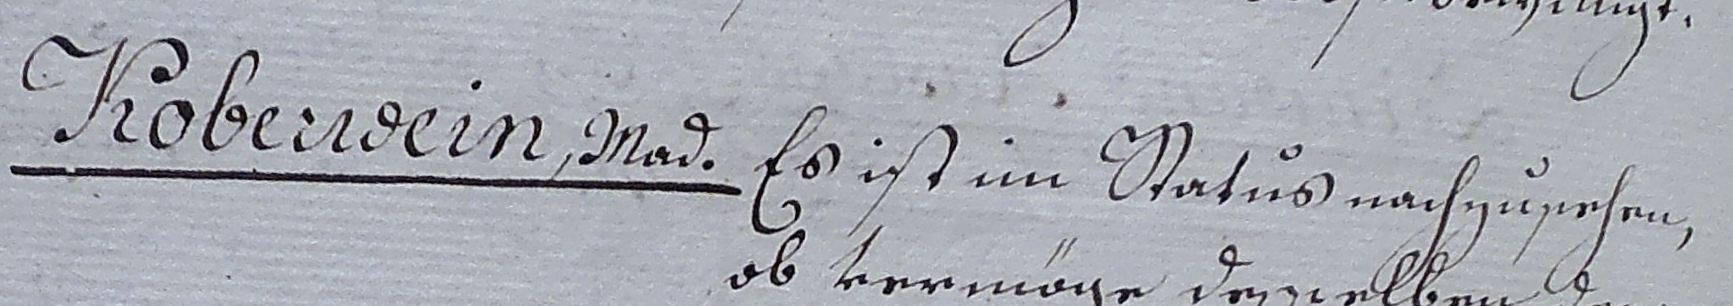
Koberwein, Mad. Es ist im Status nachzusehen,
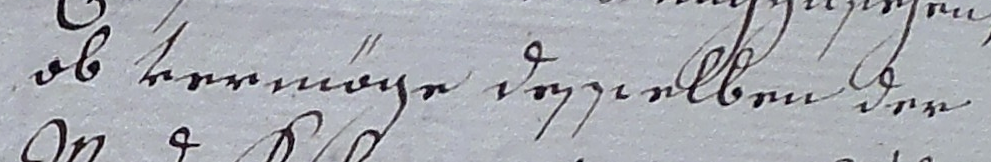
ob vermöge desselben der
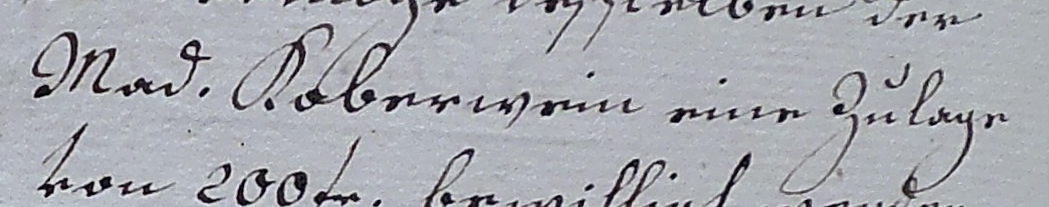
Mad. Koberwein eine Zulage
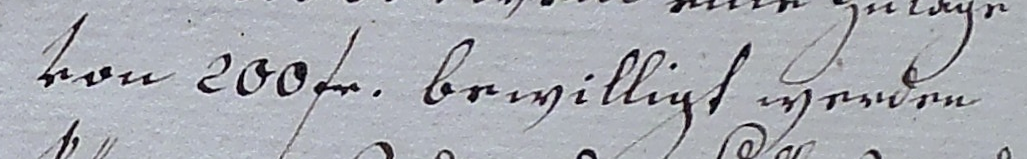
von 200fr. bewilligt werden
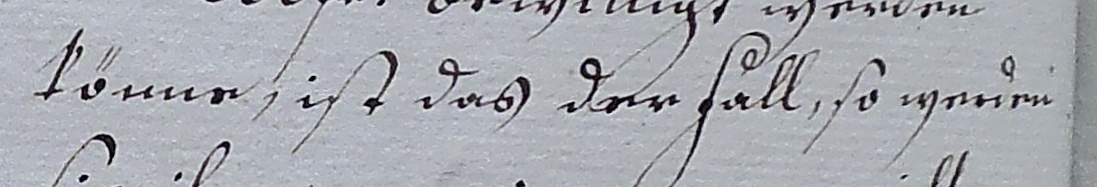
könne ist, das der Fall so werden
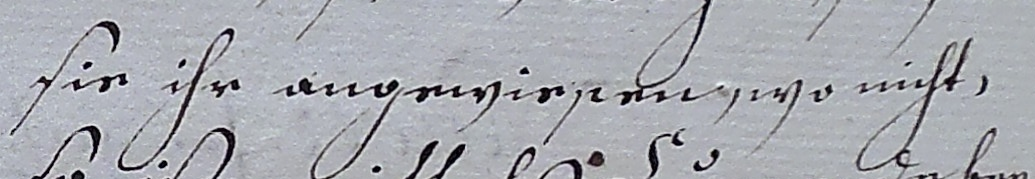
sie ihr angewiesen, wo nicht,
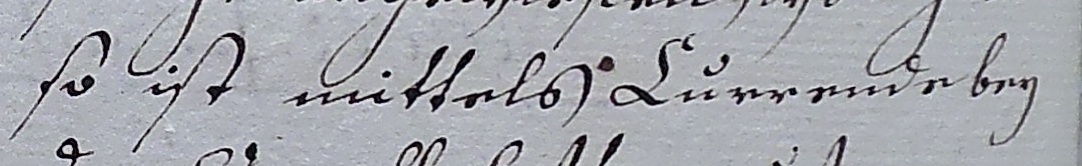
so ist mittels Currende bey
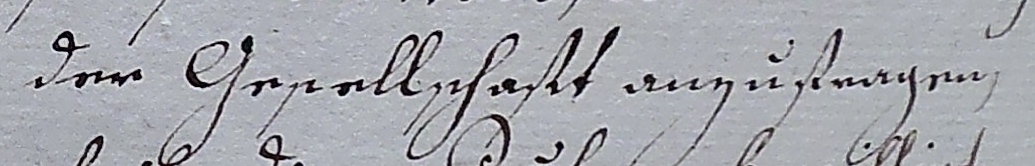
der Gesellschaft anzufragen,
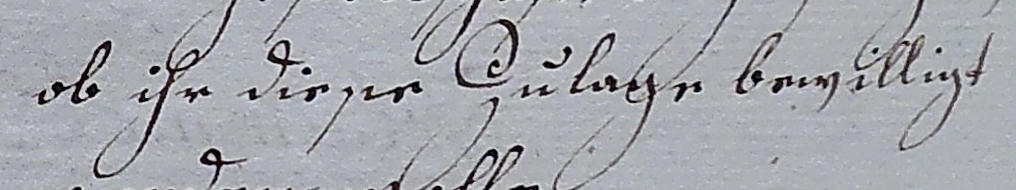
ob ihr diese Zulage bewilligt
